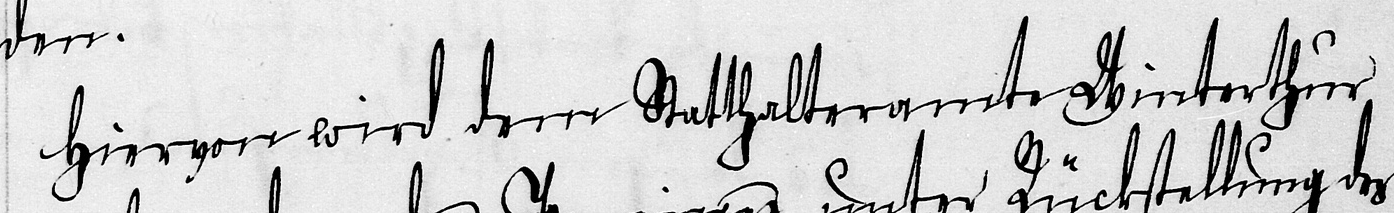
Hiervon wird dem Statthalteramte Winterthur
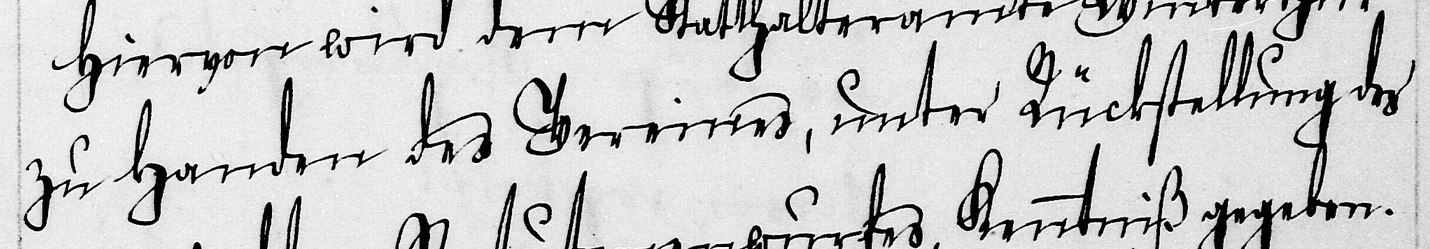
zu Handen des Vereines, unter Rückstellung des
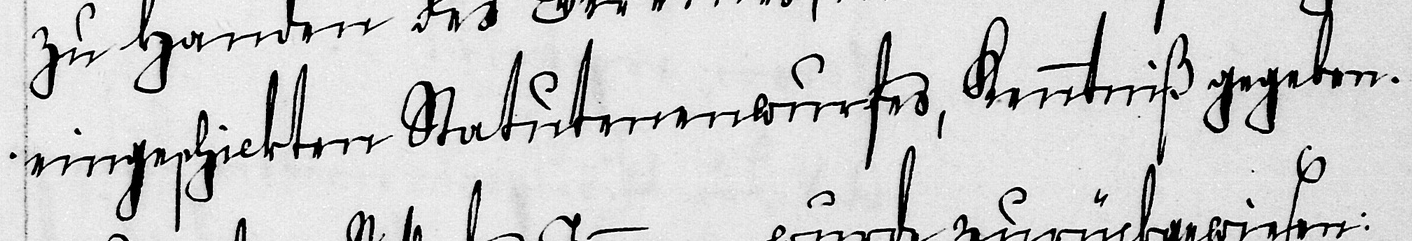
eingeschickten Statutenentwurfes, Kenntniß gegeben.
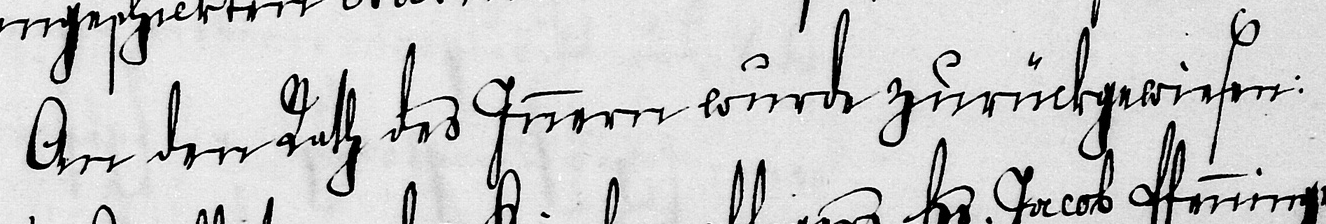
An den Rath des Innern wurde zurückgewiesen:
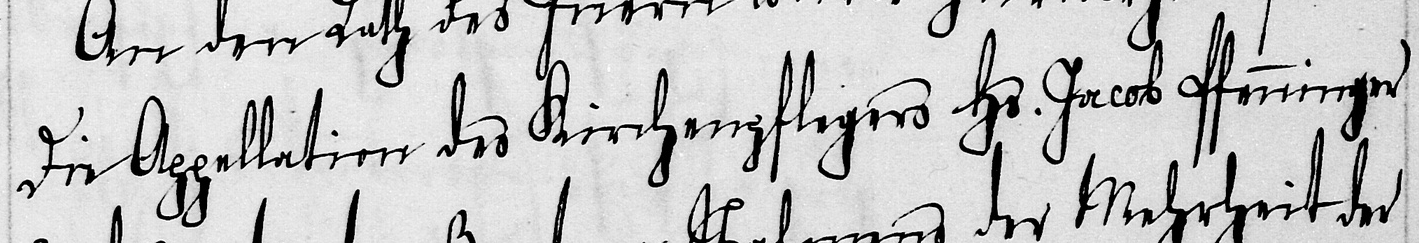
Die Appellation des Kirchenpflegers Hs. Jacob Pfennin¬
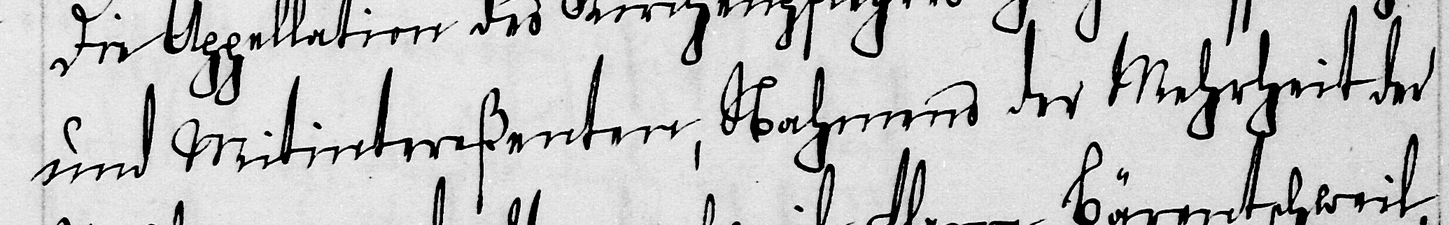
und Mitintereßenten, Nahmens der Mehrheit der
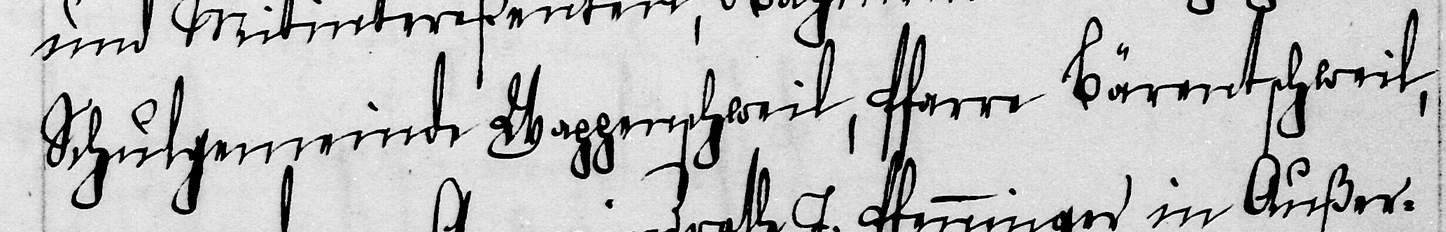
Schulgemeinde Wappenschweil, Pfarre Bärentschweil,
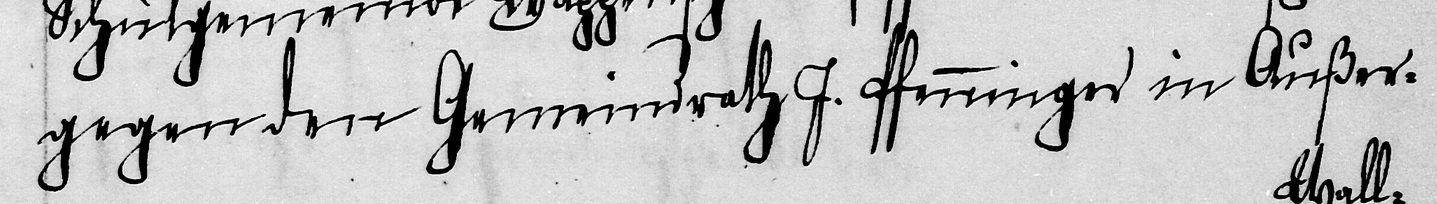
gegen den Gemeindrath J. Pfenninger in Außer-
